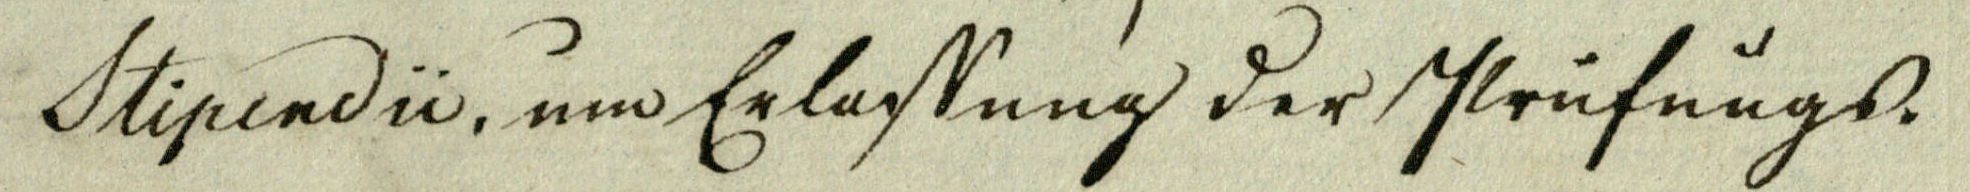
Stipendii, um Erlassung der Prüfungs¬
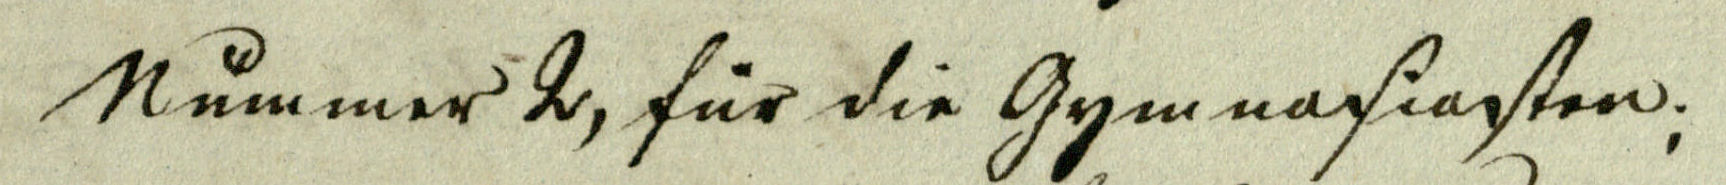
Nummer 2, für die Gymnasiasten;
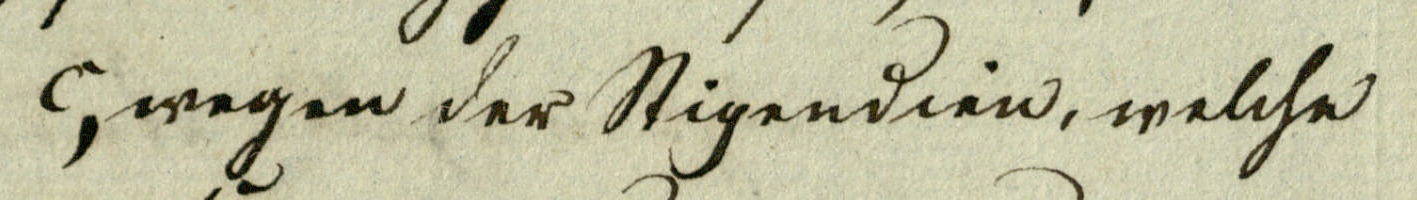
c, wegen der Stipendien, welche
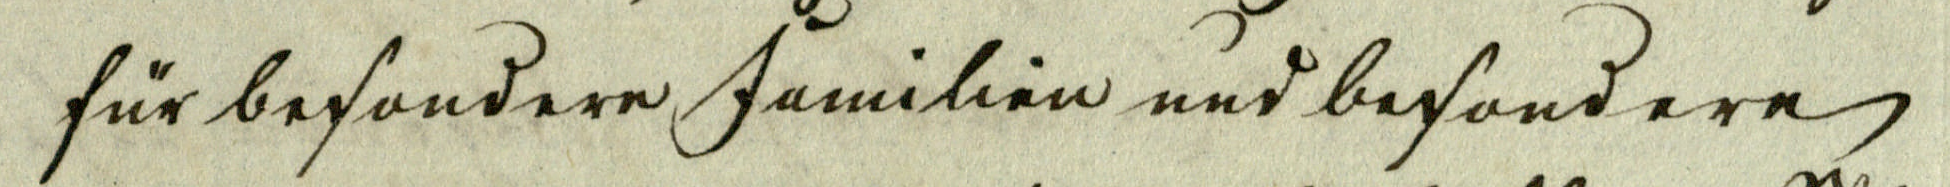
für besondere Familien und besondere
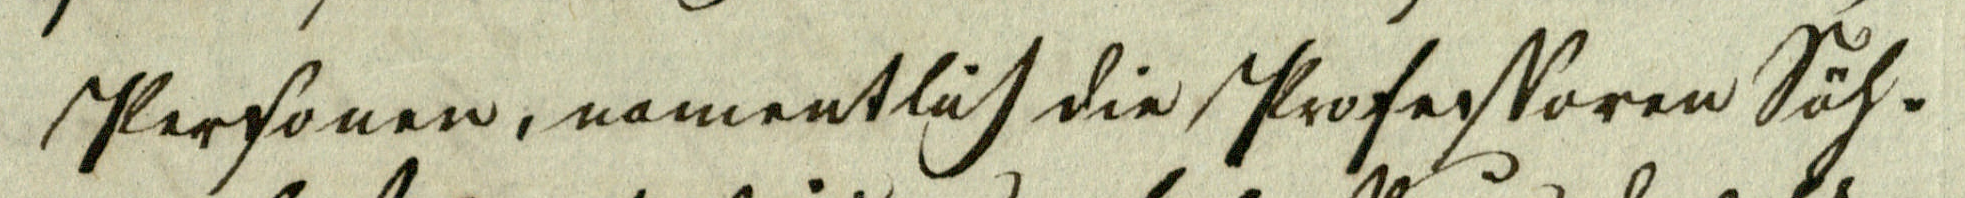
Personen, namentlich die Professoren Söh¬
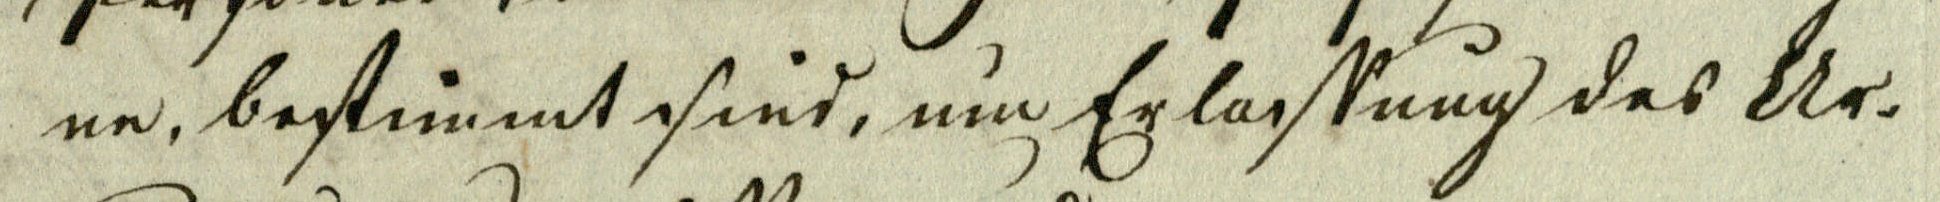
ne, bestimmt sind, um Erlassung des Ar¬
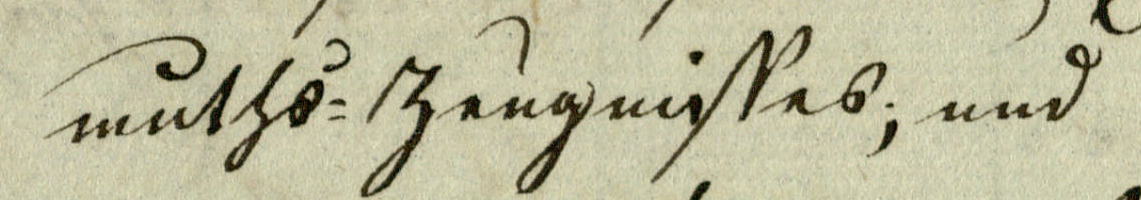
muths-Zeugnisses, und
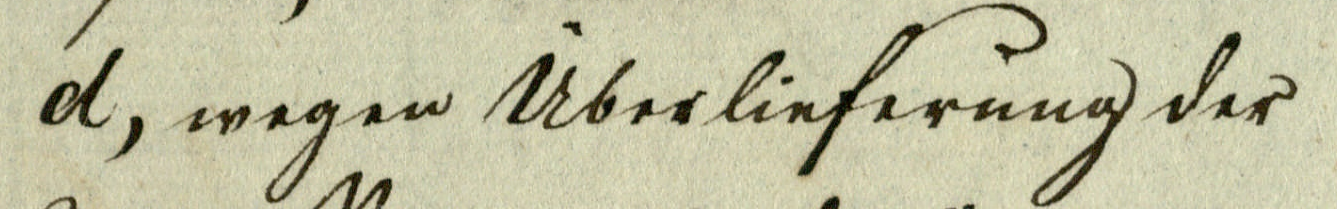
d, wegen Überlieferung der
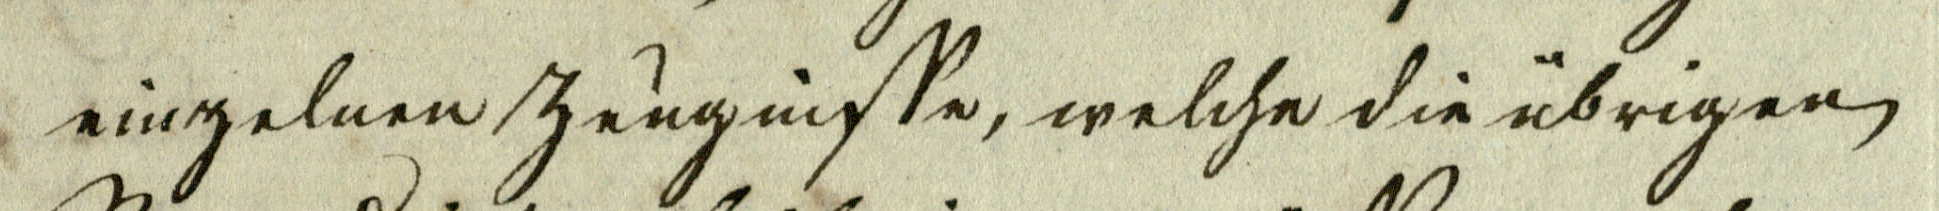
einzelnen Zeugnisse, welche die übrigen
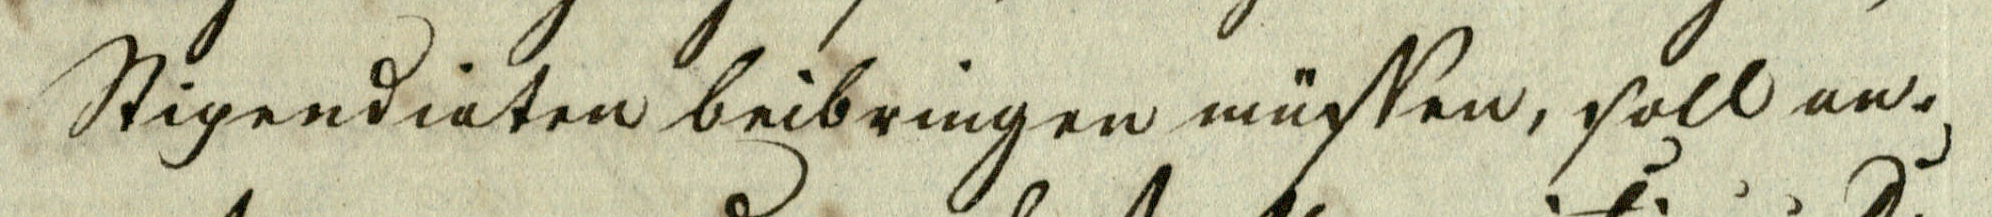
Stipendiaten beibringen müssen, soll an¬
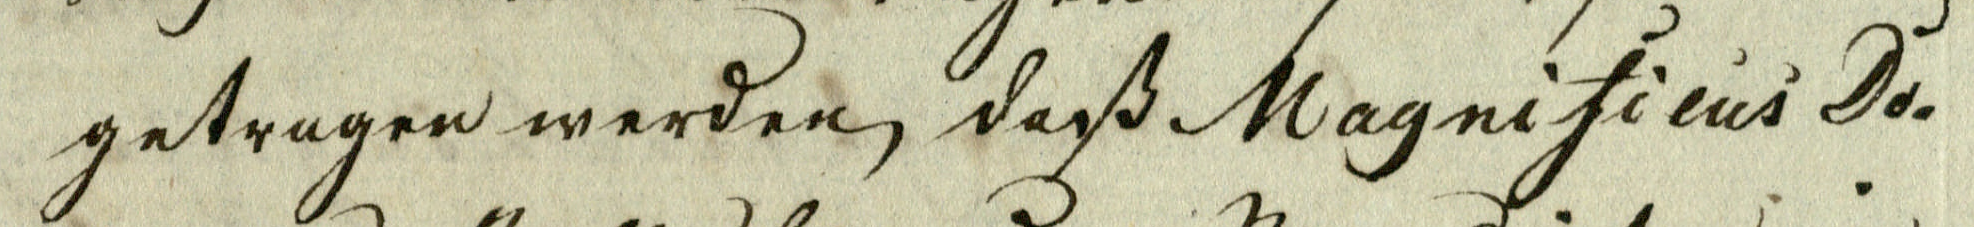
getragen werden, daß Magnificus Do¬
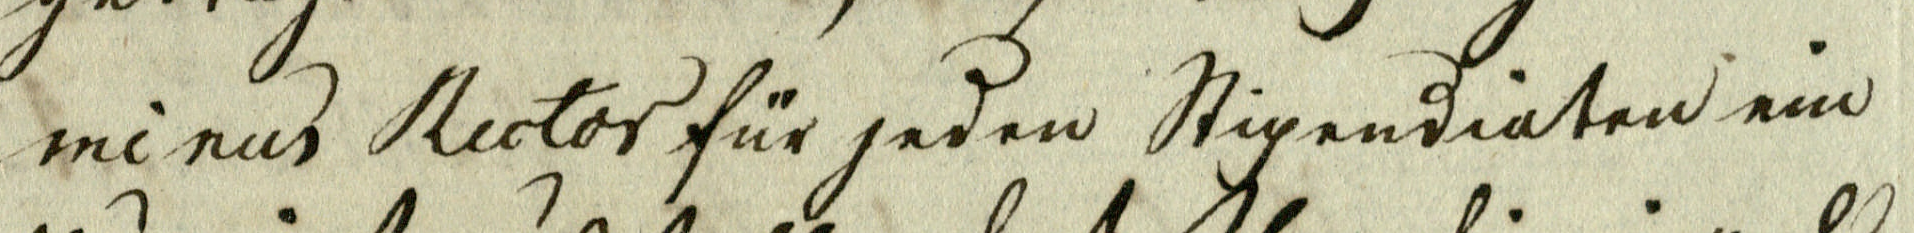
minus Rector für jeden Stipendiaten ein
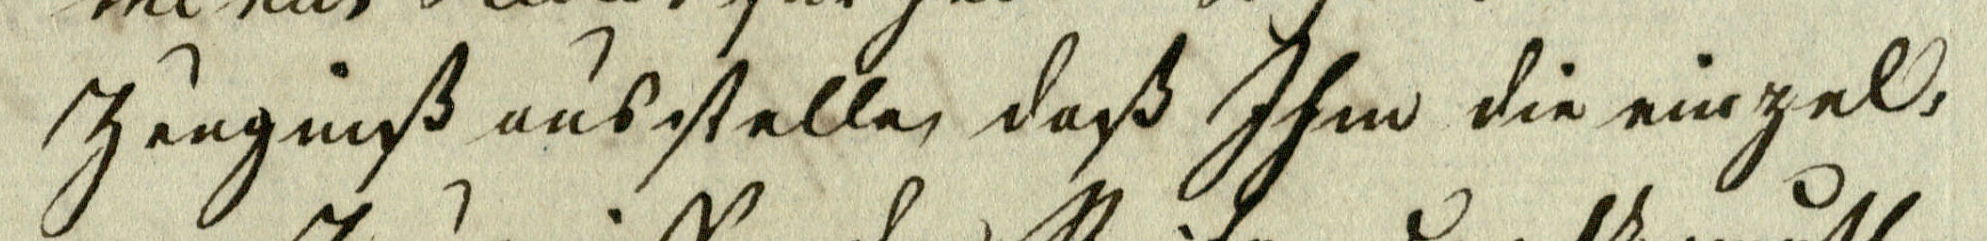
Zeugniß ausstellen daß Ihm die einzel¬
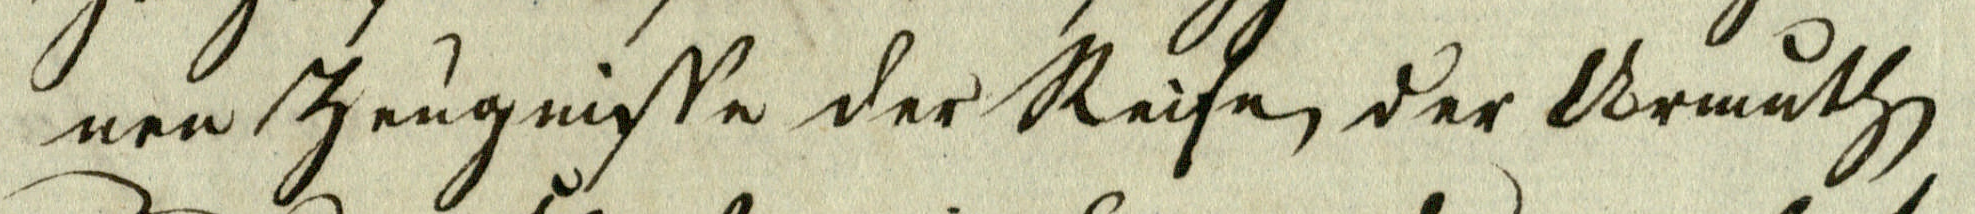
nen Zeugnisse der Reife, der Armuth,
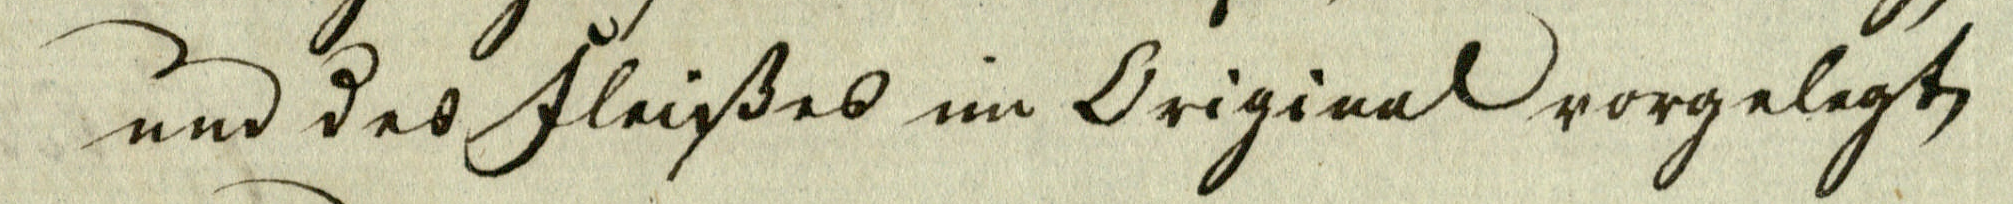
und des Fleißes im Original vorgelegt
